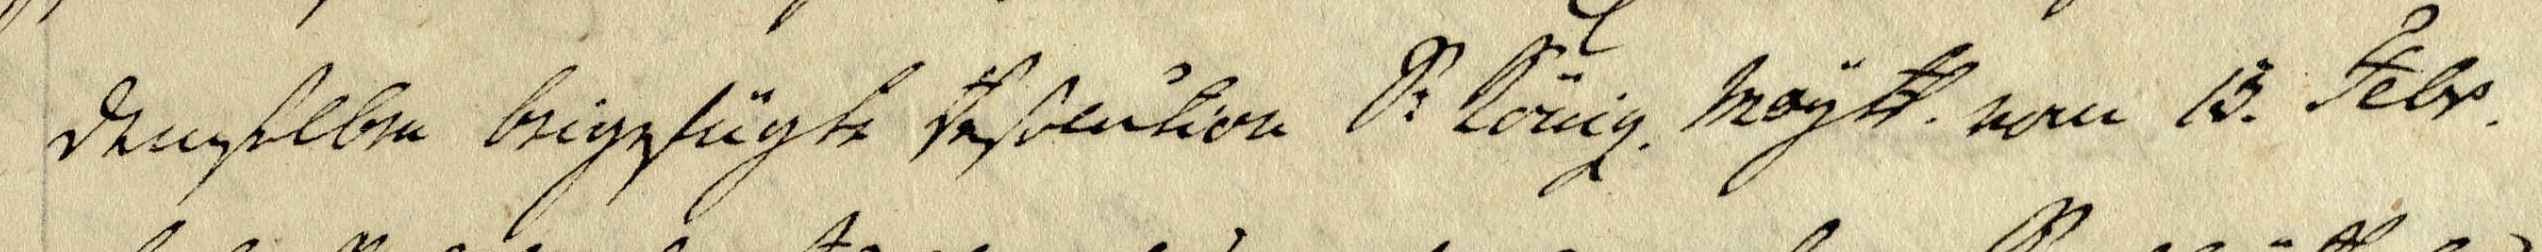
demselben beigefügte Resolution Sr König. Maÿtt. vom 13. Febr.
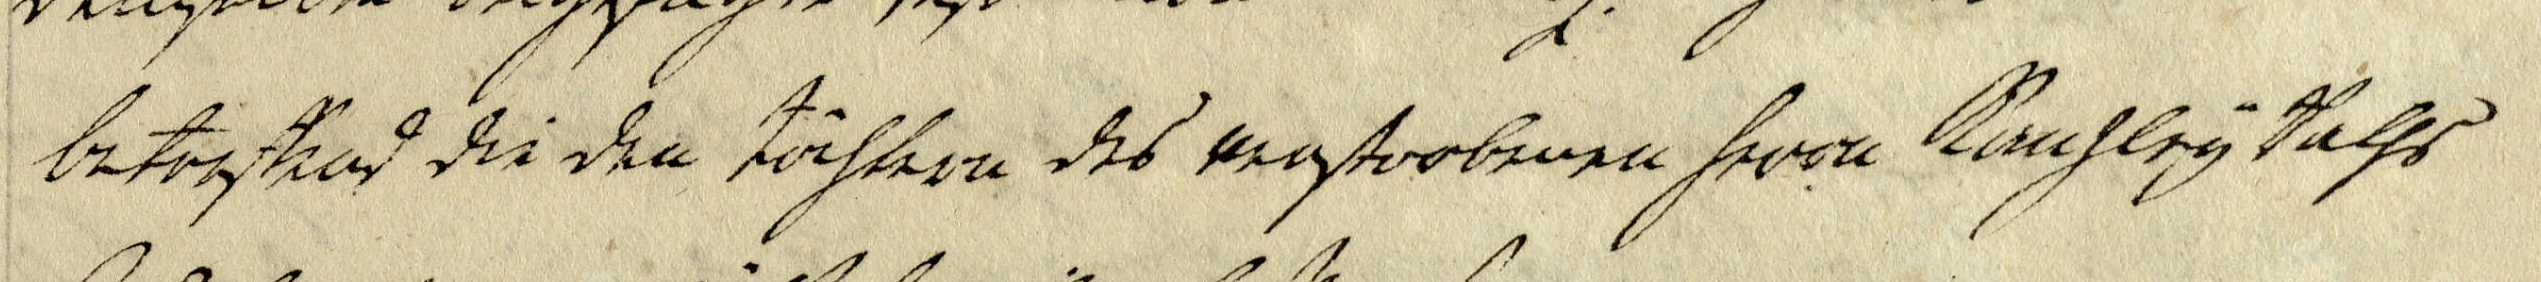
betreffend die den Töchtern des verstorbenen Herrn Kanzleÿ Raths
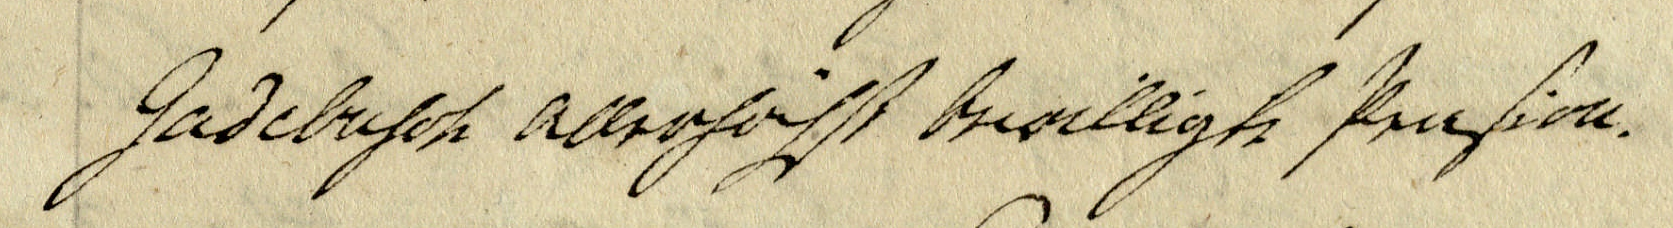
Gadebusch allerhöchst bewilligte Pension.
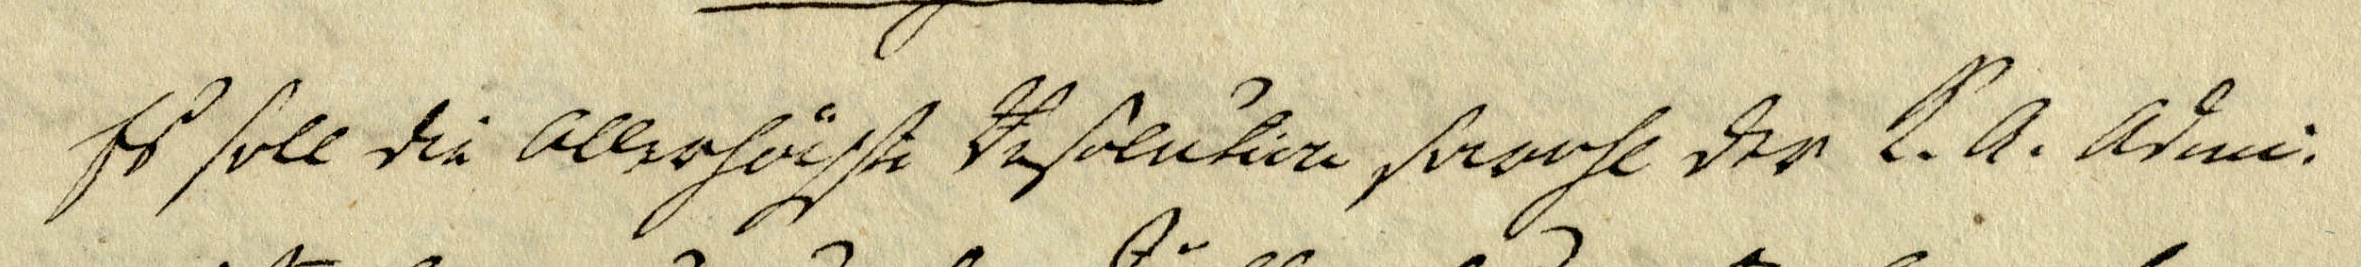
Es soll die Allerhöchste Resolution sowohl der K. A. Admi¬
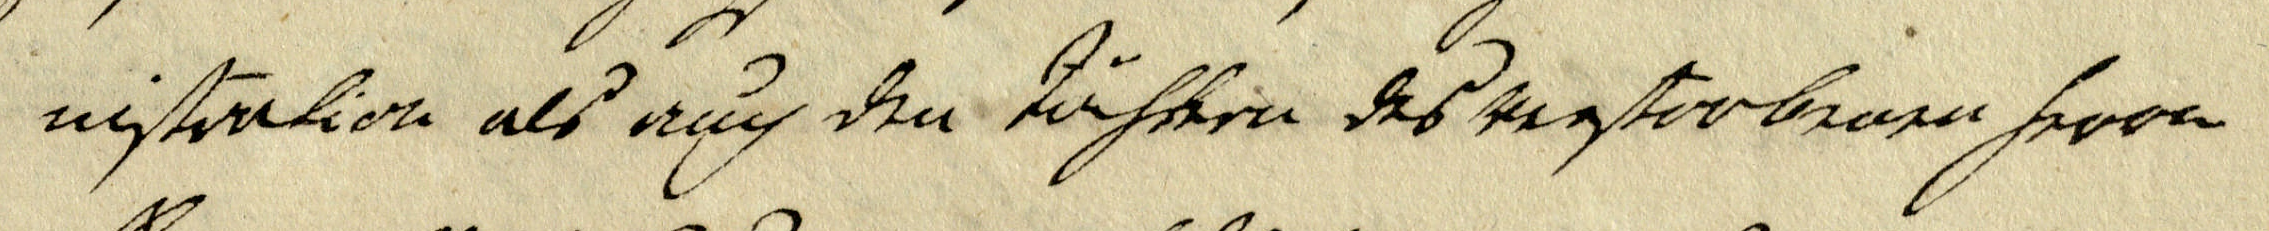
nistration als auch den Töchtern des verstorbenen Herrn
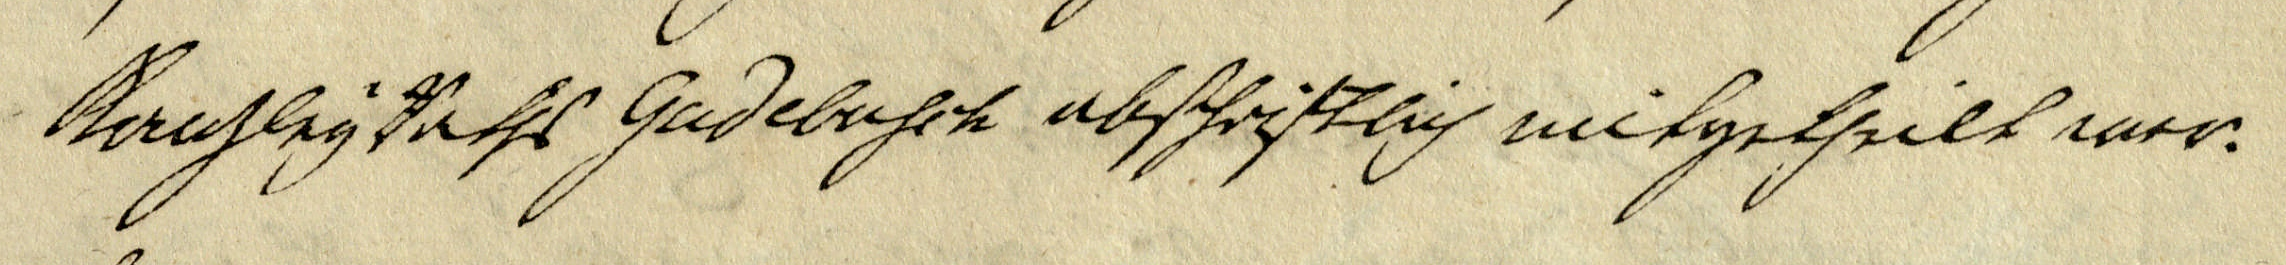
Kanzleÿ Raths Gadebusch abschriftlich mitgetheilt wer¬
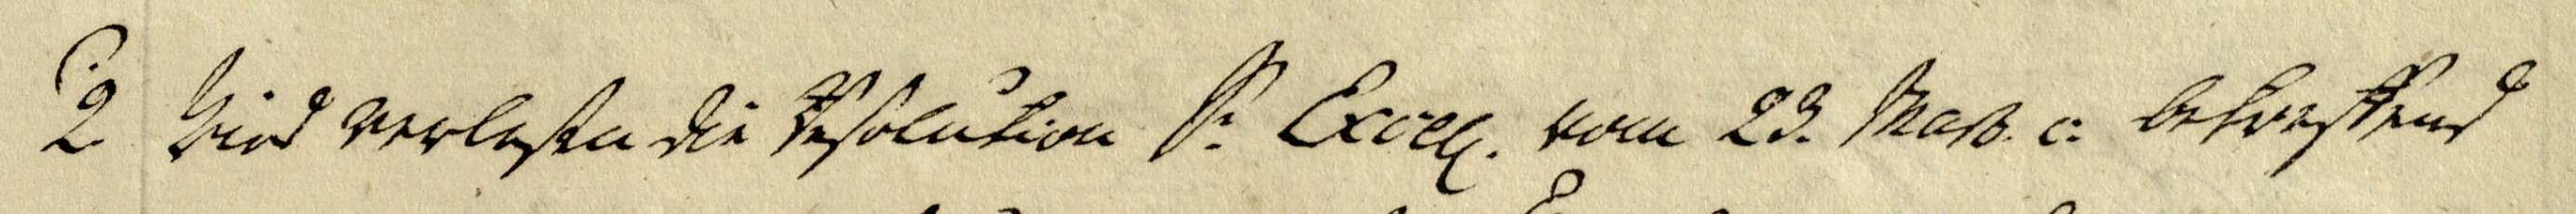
2. Wird verlesen die Resolution Sr. Excel. vom 23. Mart c. betreffend
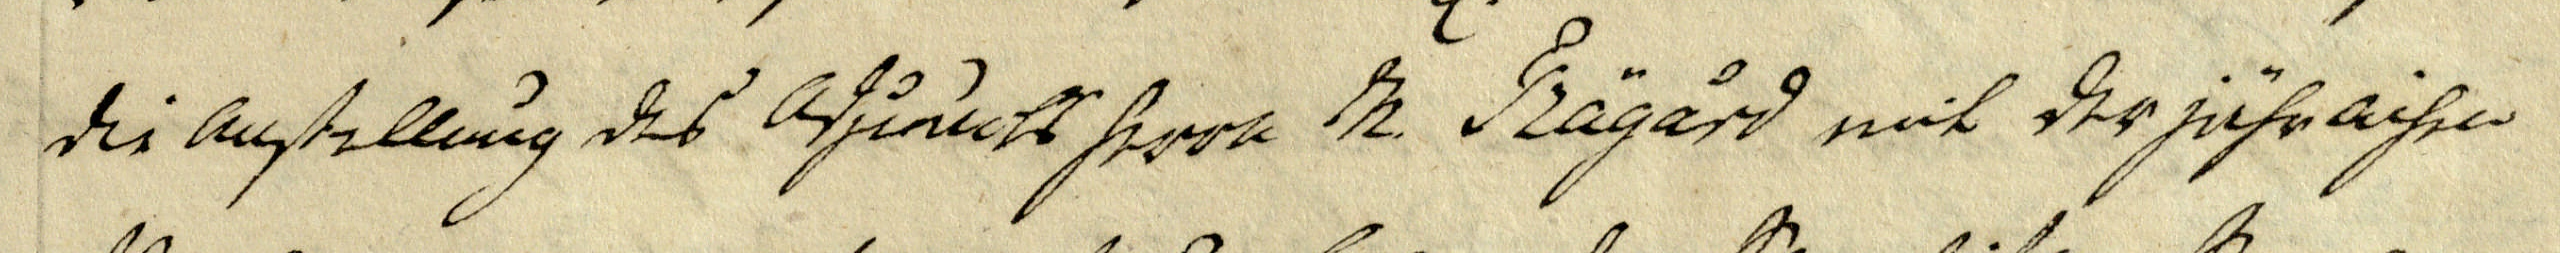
die Anstellung des Adjuncts herrn M. Trägård mit der jährlichen
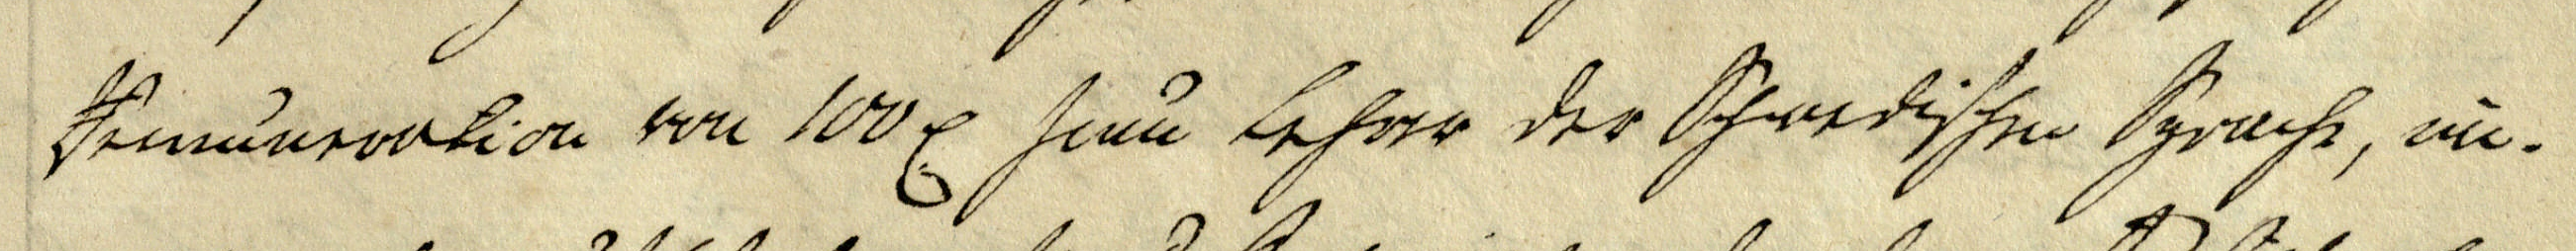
Remuneration von 100 l. zum Lehrer der Schwedischen Sprache, im¬
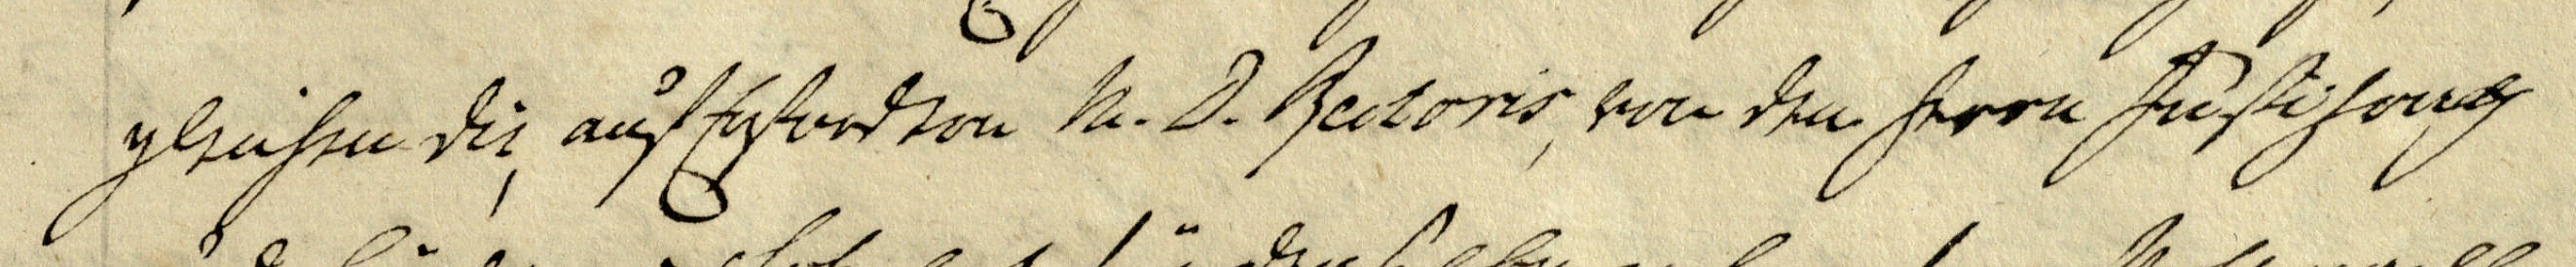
gleichen die auf Erfordern M. D. Rectoris, von den Herrn Justizrath
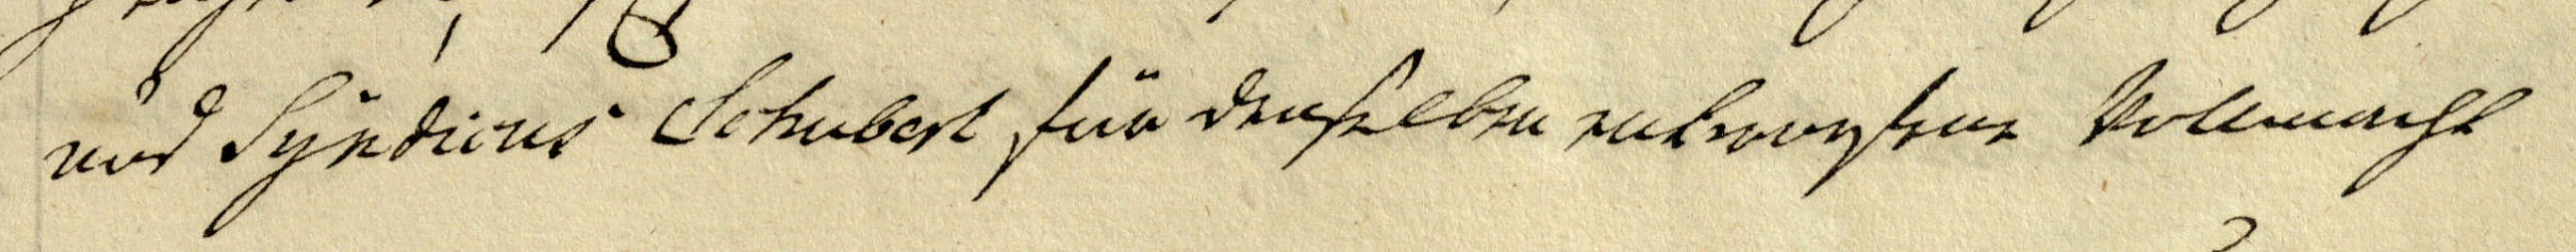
und Sÿndicus Schubert für denselben entworfene Vollmacht
